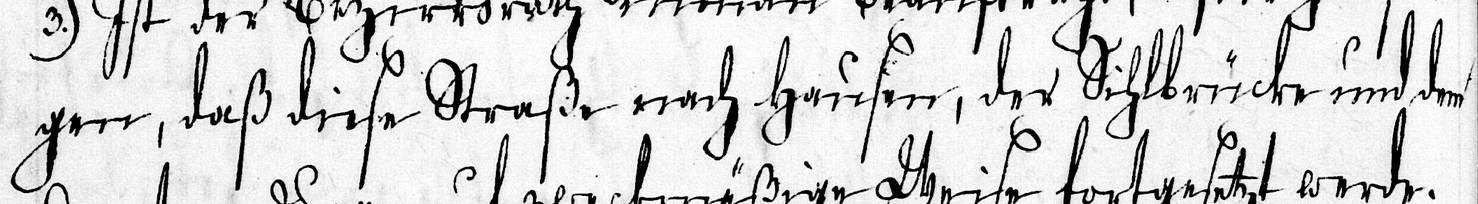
gen, daß diese Straße nach Hausen, der Sihlbrücke und
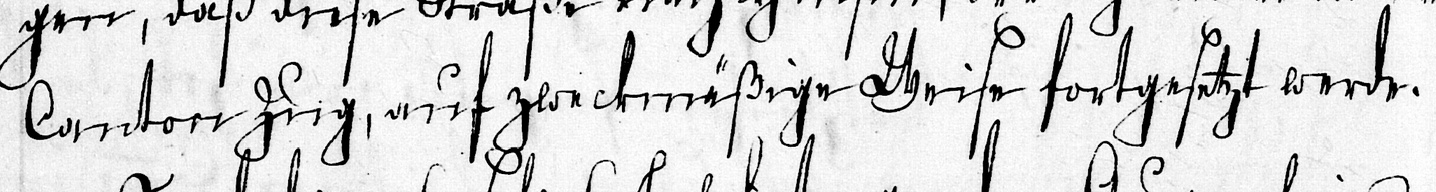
Canton Zug, auf zweckmäßige Weise fortgesetzt werde.
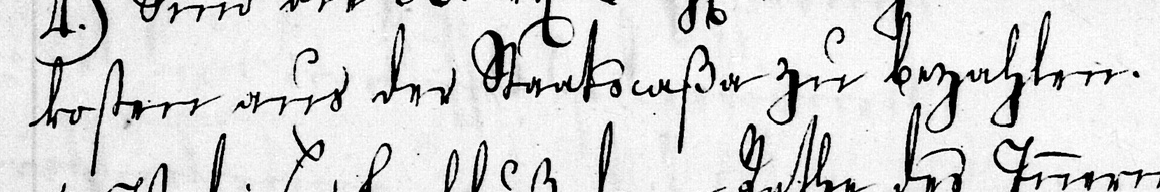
kosten aus der Staatscaße zu bezahlen.
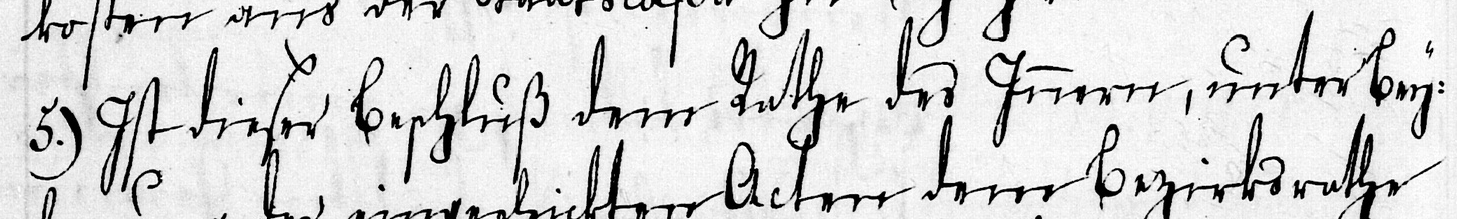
5.) Ist dieser Beschluß dem Rathe des Innern, unter Bey¬
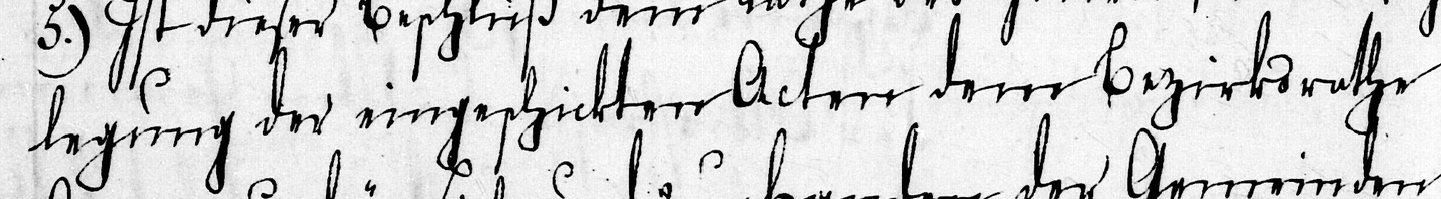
legung der eingeschickten Acten dem Bezirksrathe
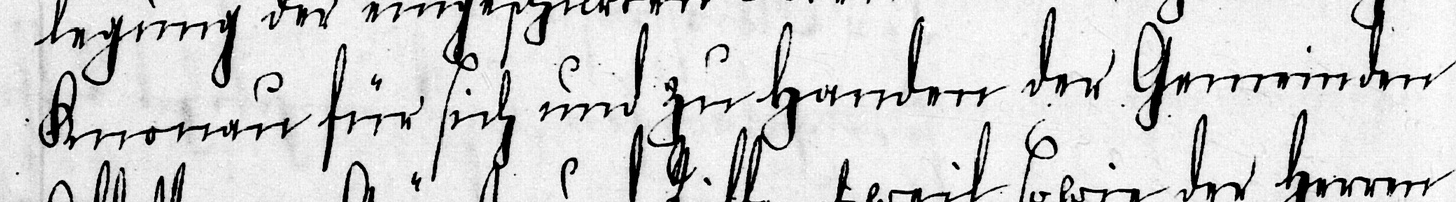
Knonau für sich und zu Handen der Gemeinden
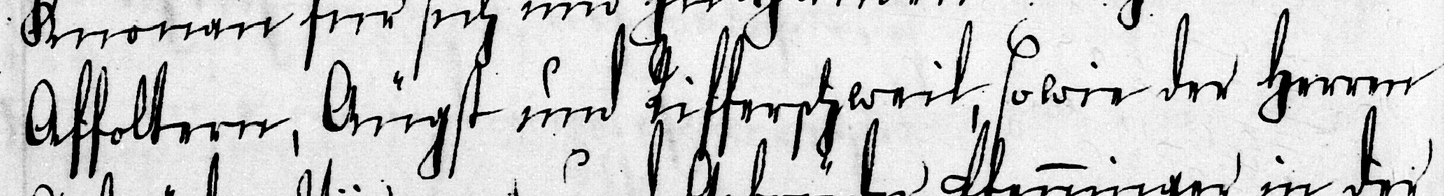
Affoltern, Äugst und Rifferschweil, sowie der Herren
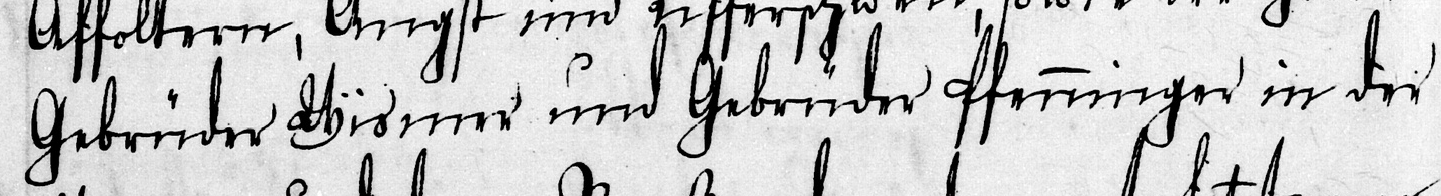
Gebrüder Wismer und Gebrüder Pfenninger in der
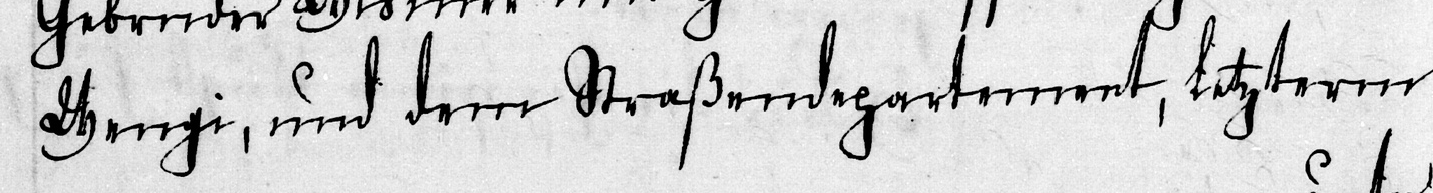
Wengi, und dem Straßendepartement, Letzterm
